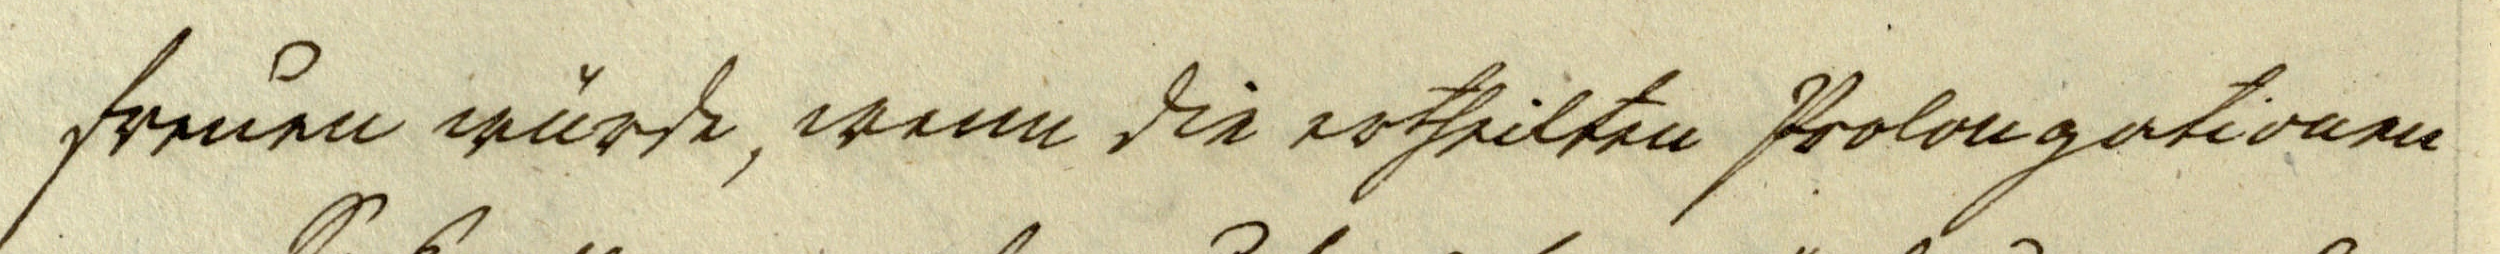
freuen würde, wenn die ertheilten Prolongationen
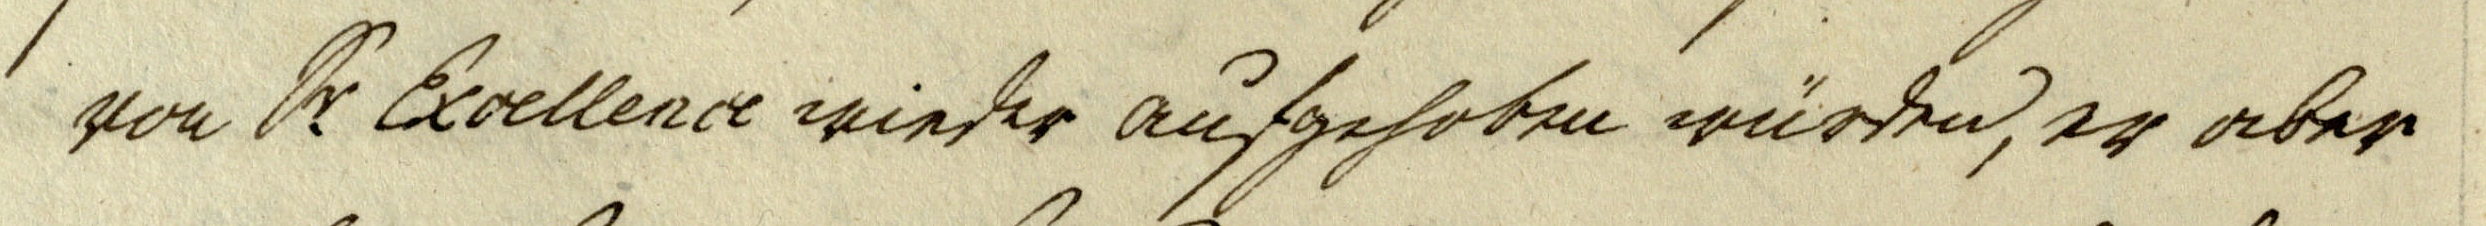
von Sr Excellence wieder aufgehoben würden, er aber
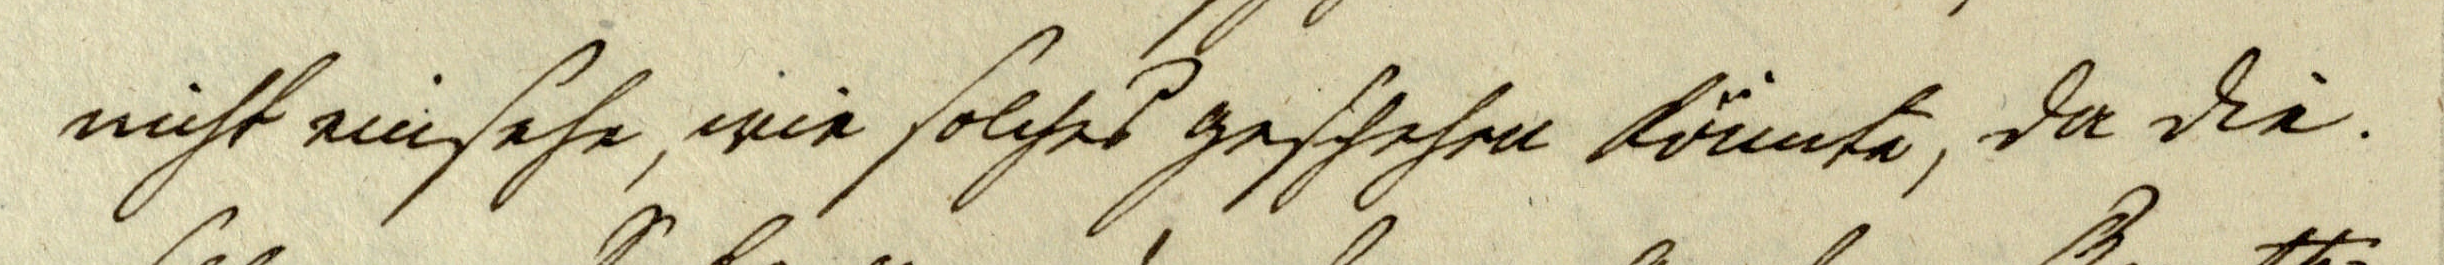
nicht einsehe, wie solches geschehen könnte, da die¬
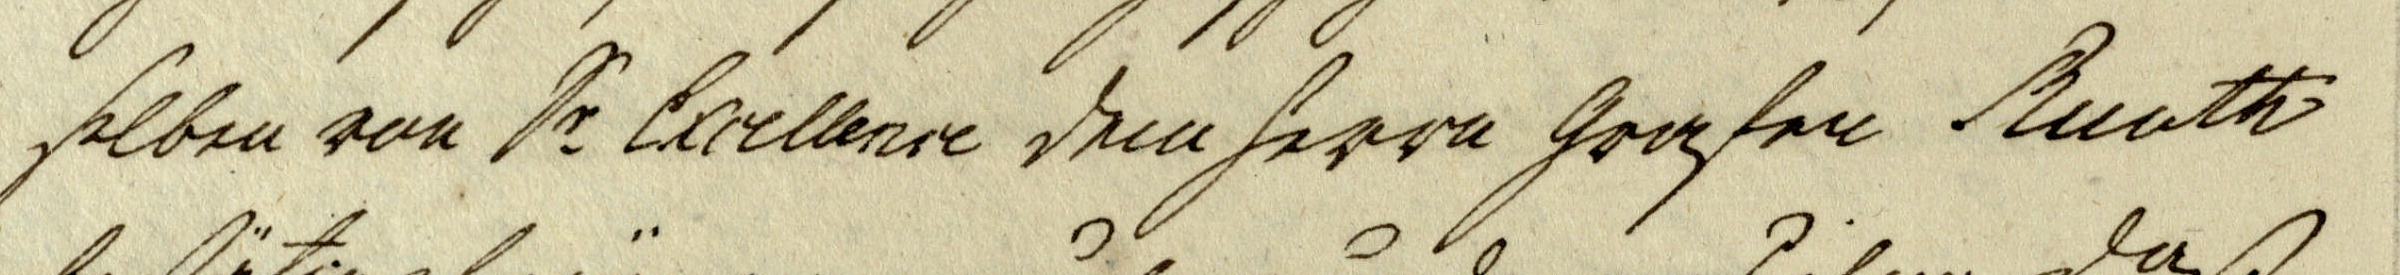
selben von Sr Excellence dem Herrn Grafen Ruuth
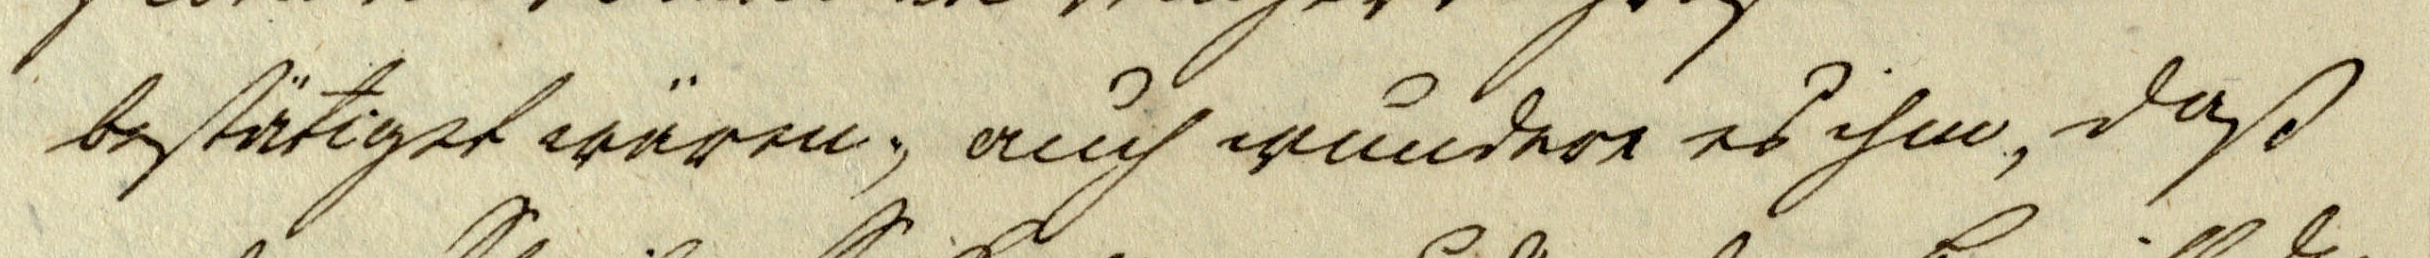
bestätiget wären; auch wundere es ihm, daß
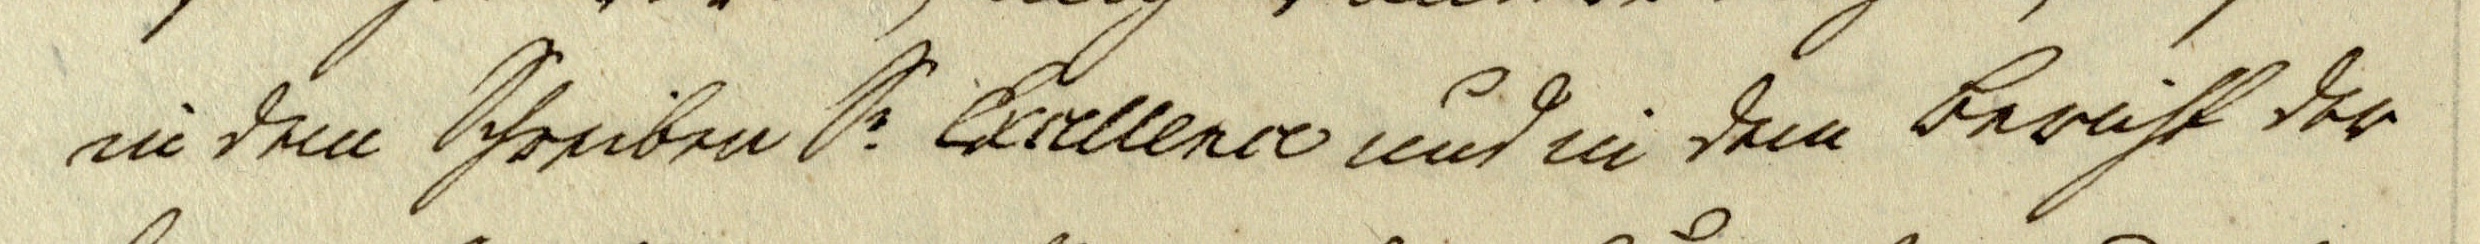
in dem Schreiben Sr Excellence und in dem Bericht der
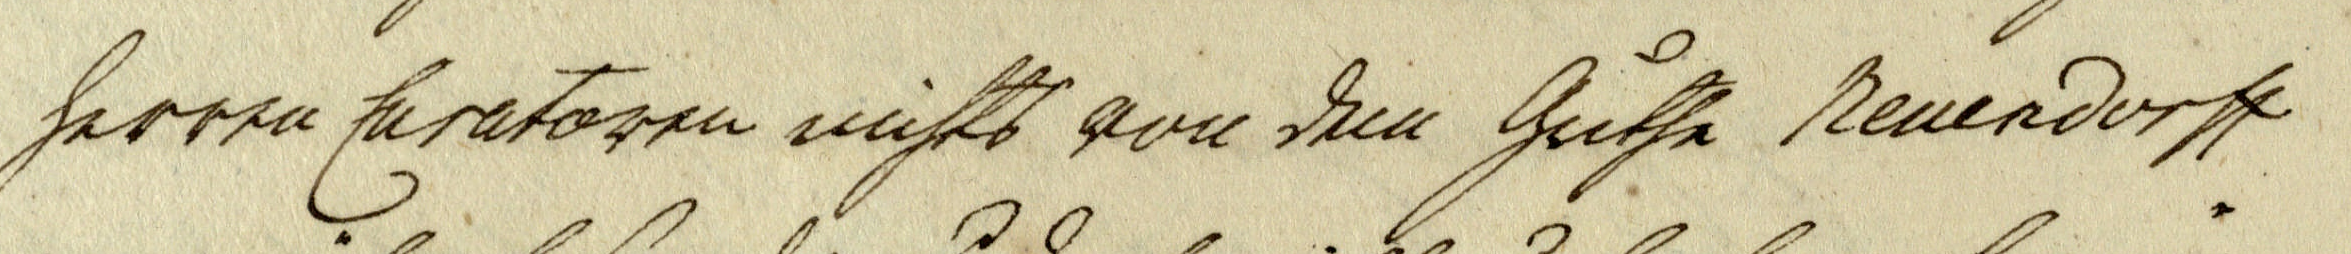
Herren Curatoren nichts von dem Guthe Neuendorff
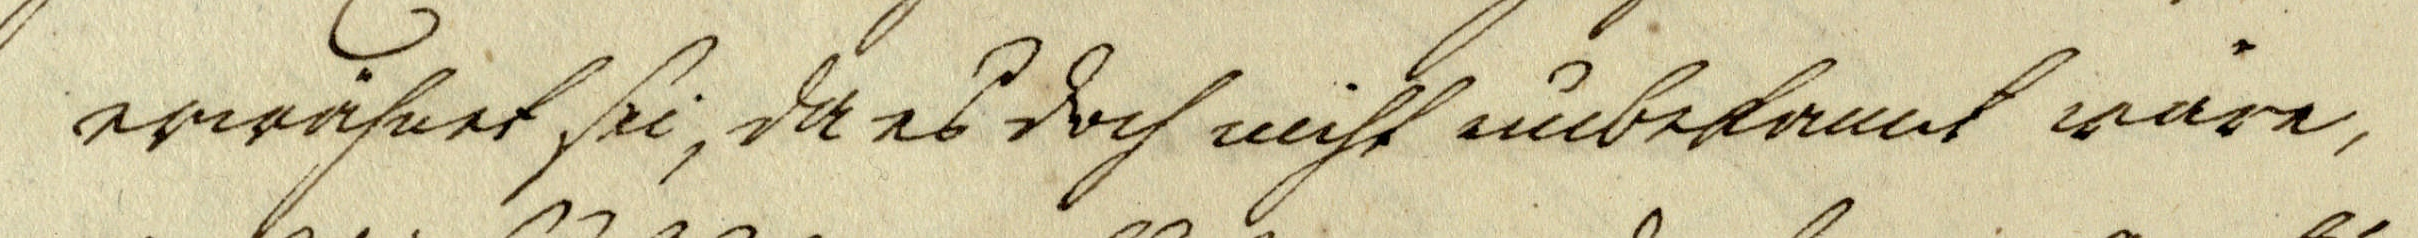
erwähnet sei, da es doch nicht unbekannt wäre,
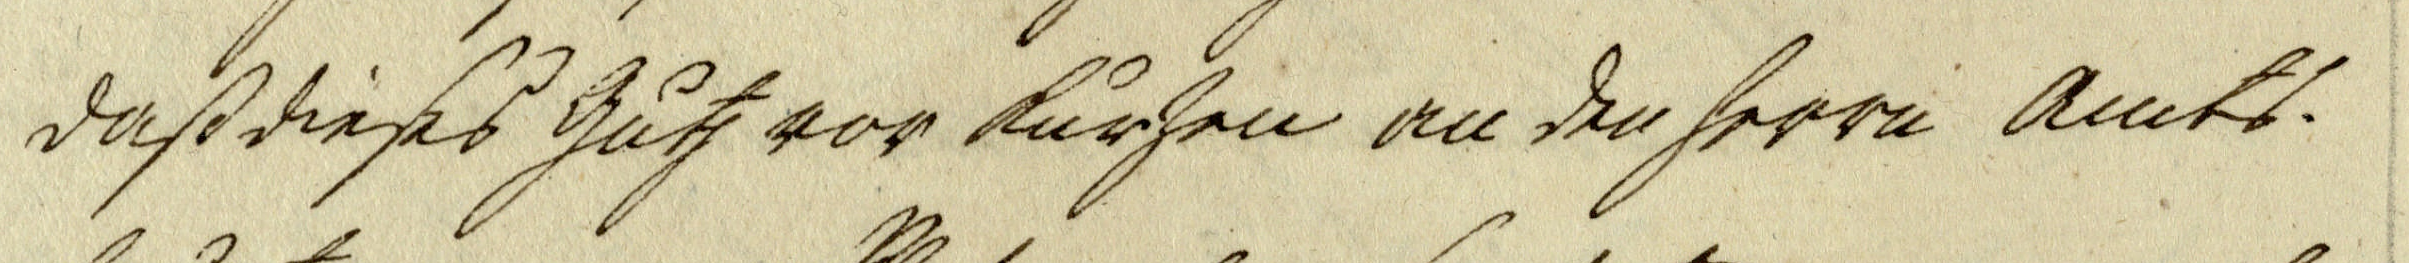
daß dieses Guth vor kurzen an den Herrn Amts¬
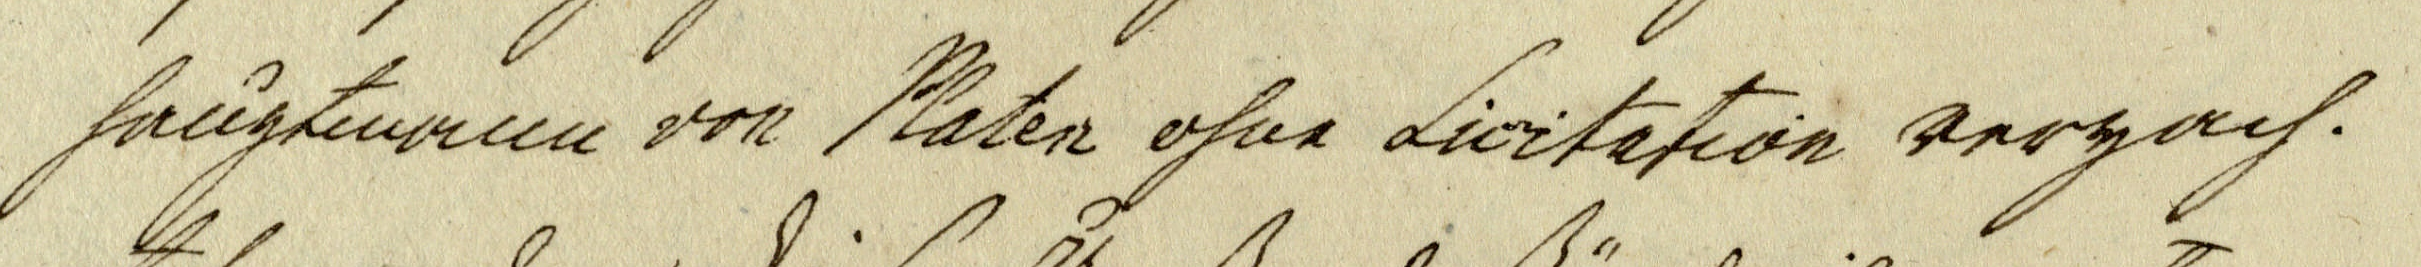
Hauptmann von Platen ohne Licitation verpach¬
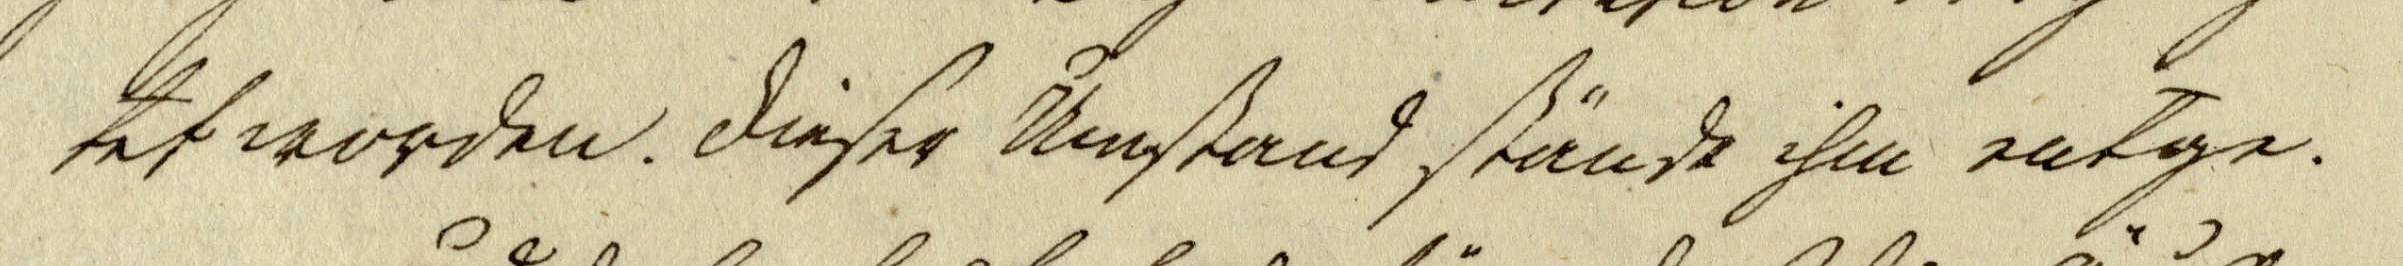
tet worden. Dieser Umstand stände ihm entge¬
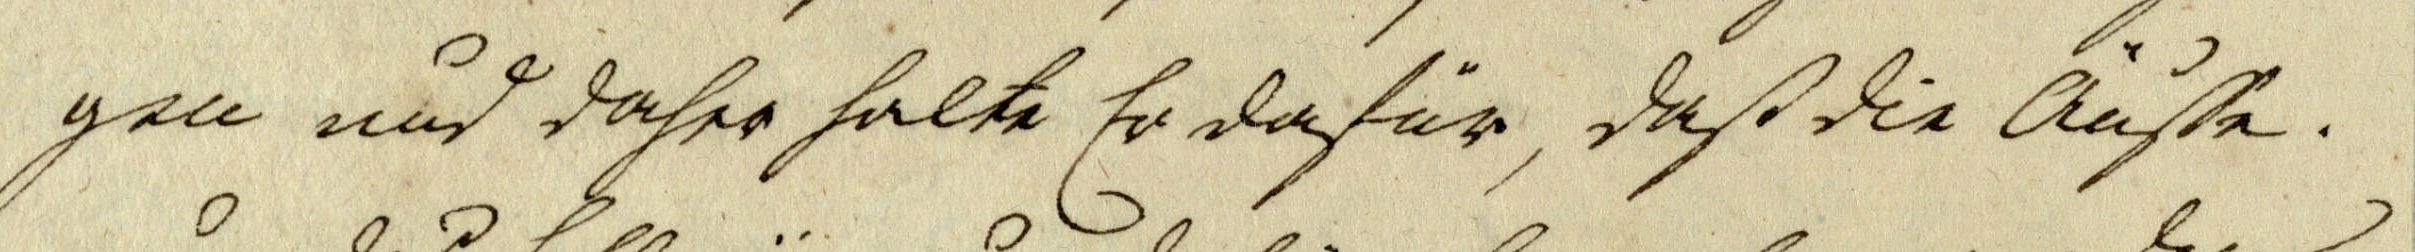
gen und daher halte Er dafür, daß die Äusse¬
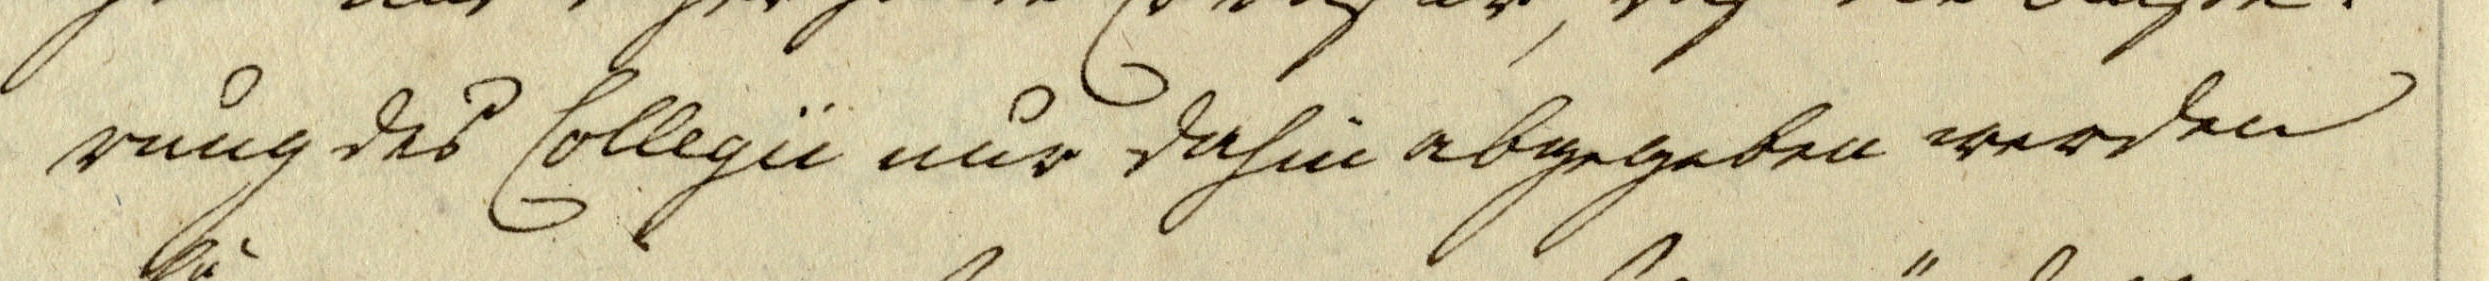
rung des Collegii nur dahin abgegeben werden
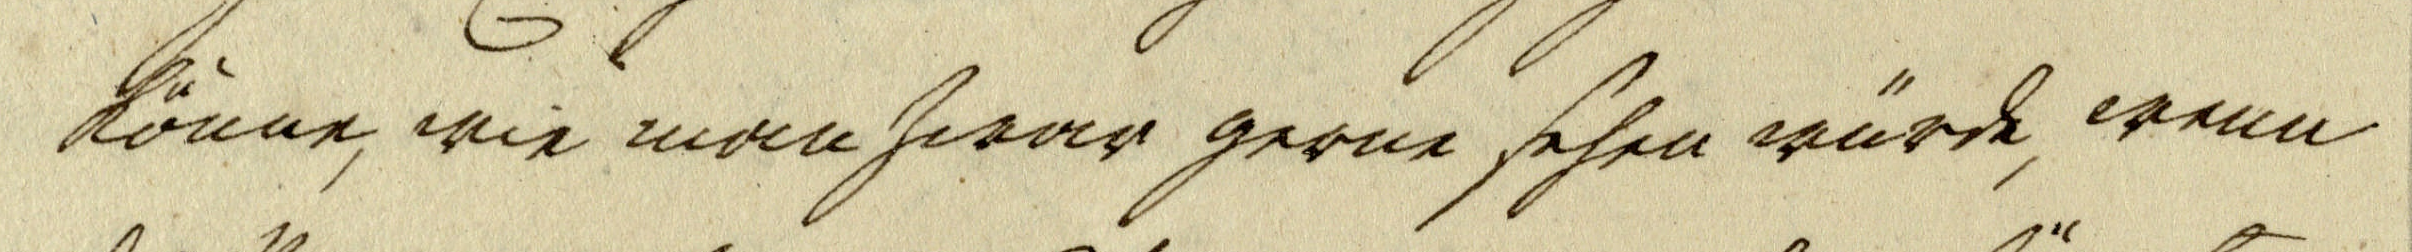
könne, wie man zwar gerne sehen würde, wenn
